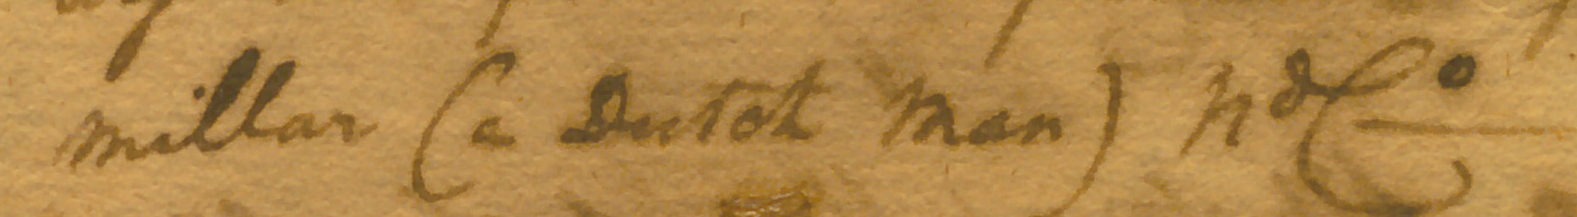millar (a Dutch man) n^o C^o-
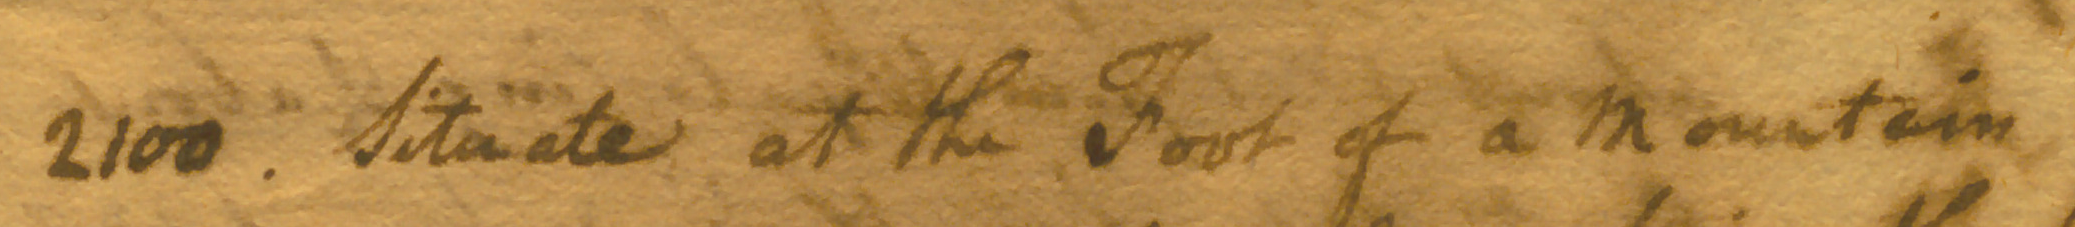2100 Situate at the Foot of a mountain
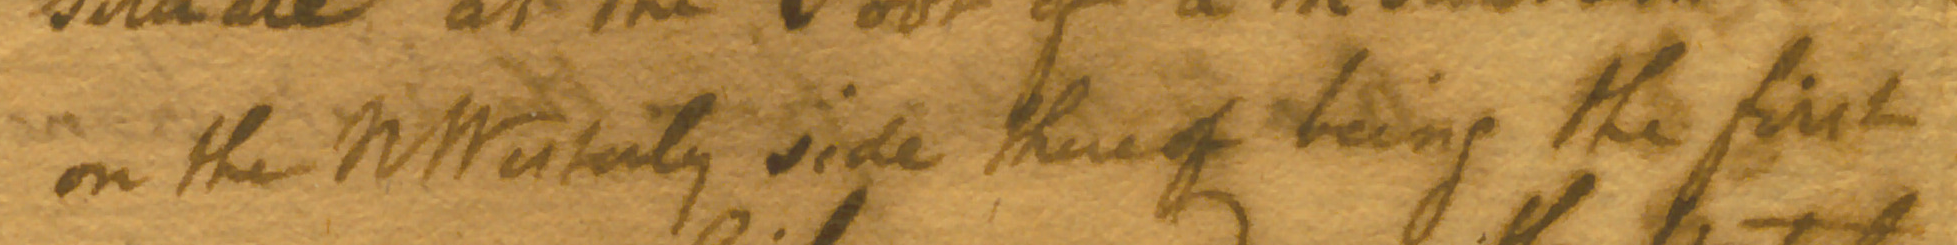on the NWesterly side thereof being the first
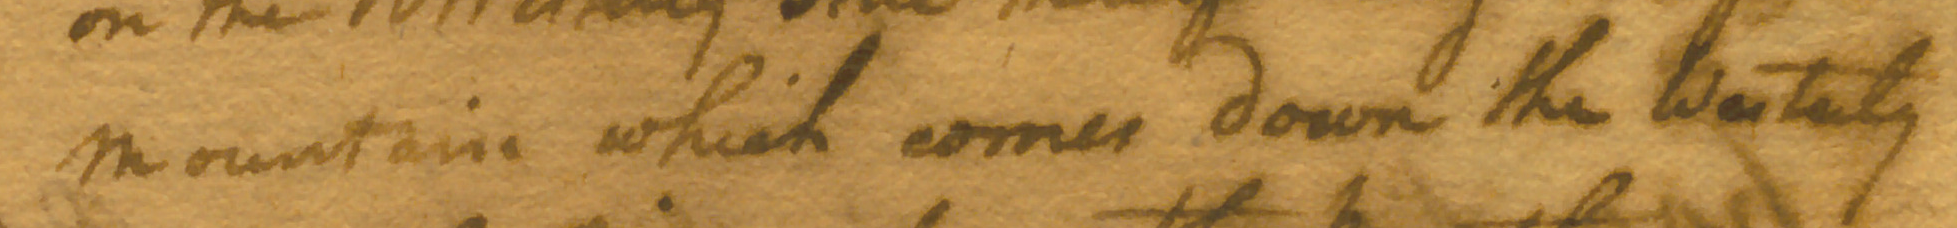mountain which comes down the Westerly
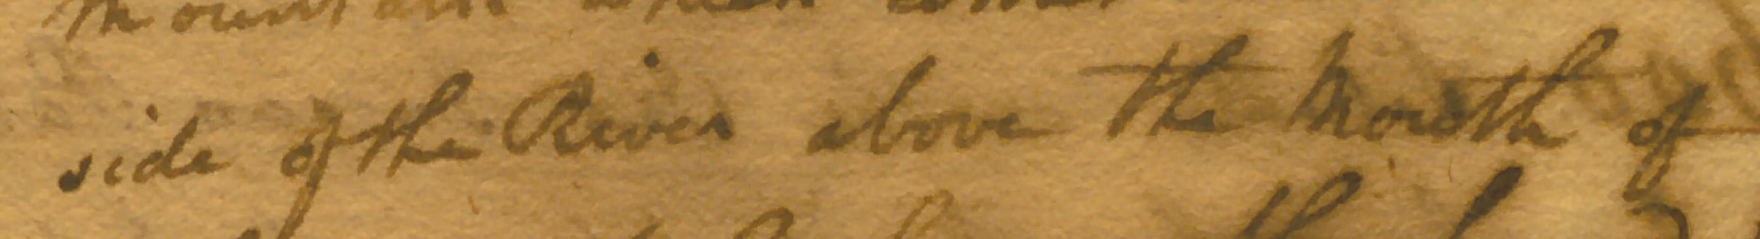side of the River above the Mouth of
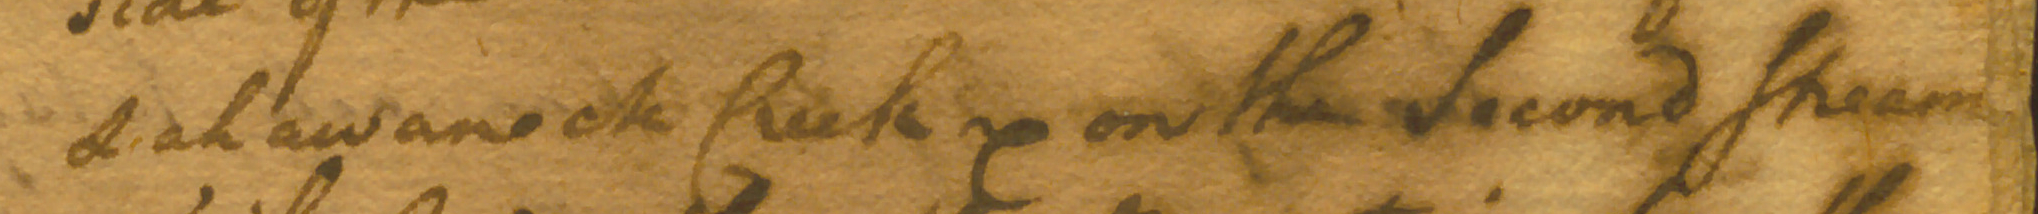sahawanock Creek & on the Second Stream
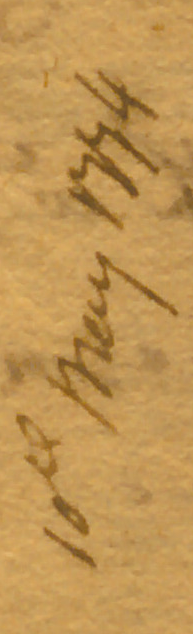10^th May 1774
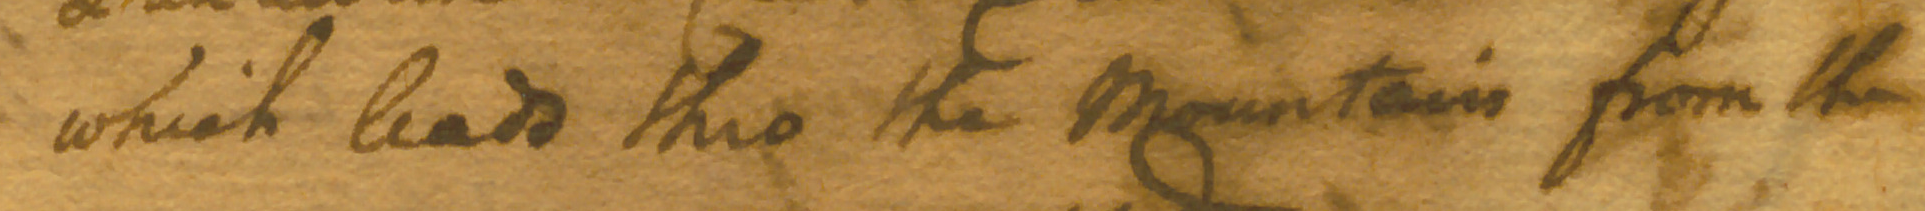which leads thro the Mountain from the
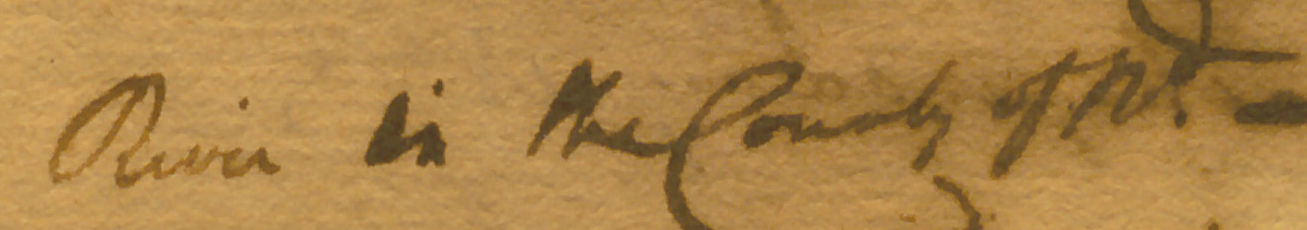River in the County of N^d.-
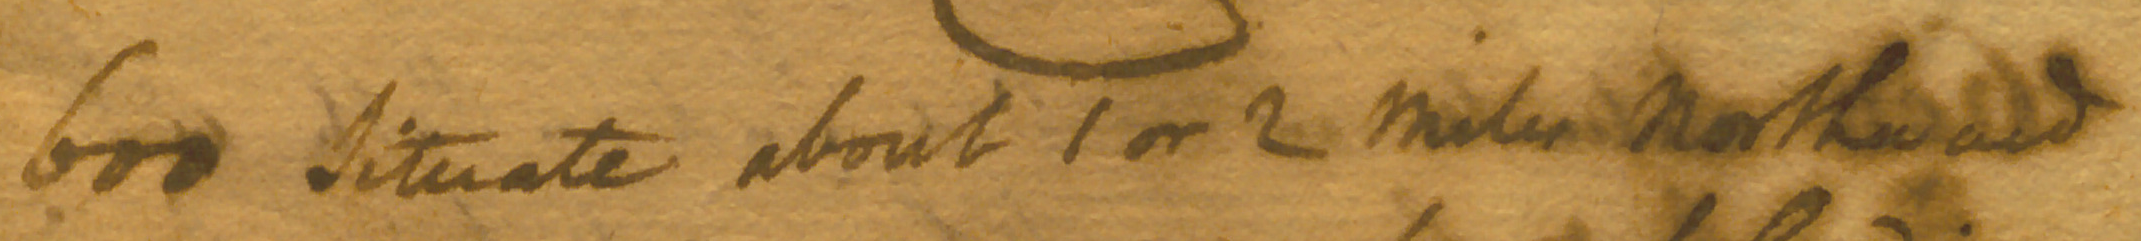600 Situate about 1 or 2 Miles Northward
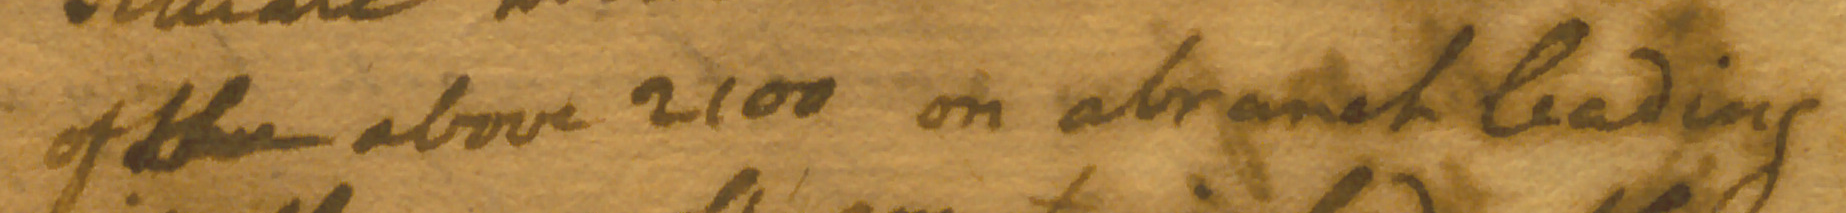of the above 2100 on a branch leading
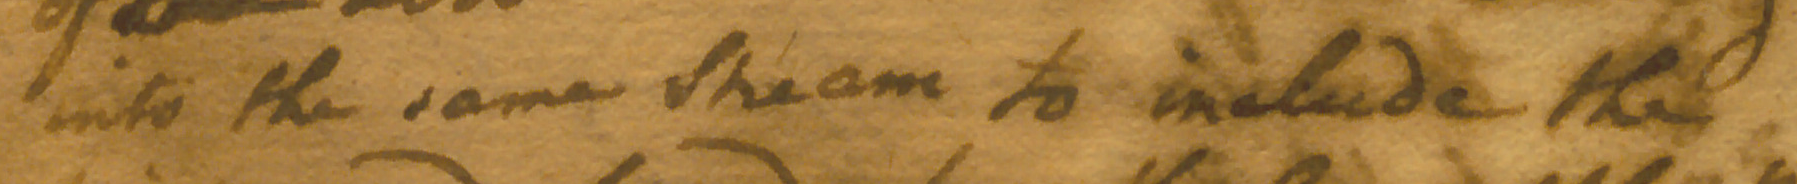into the same Stream to include the
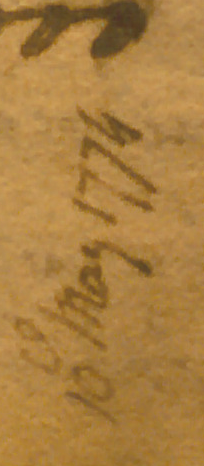10^th May 1774
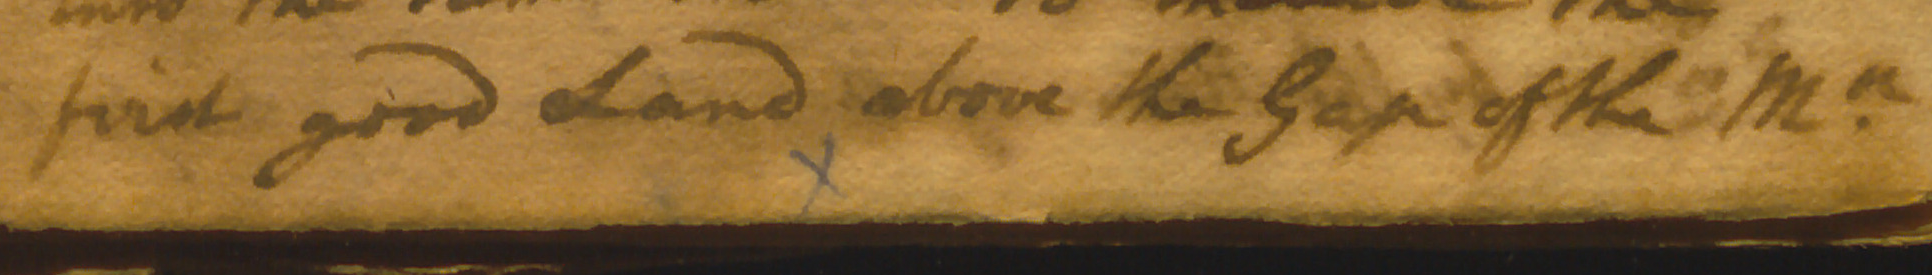first good Land above the Gap of the M^n.
